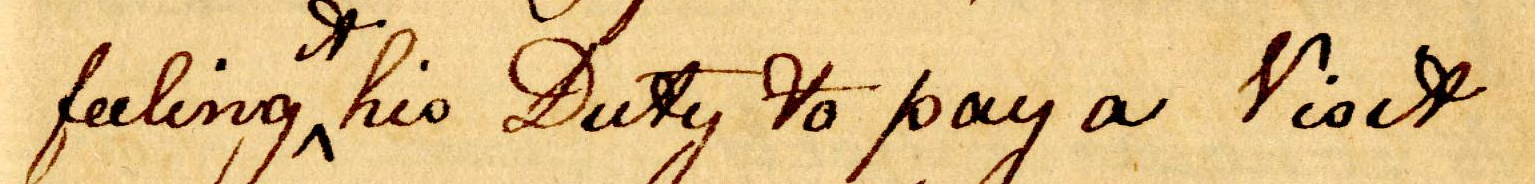feeling ^ his Duty to pay a Visit
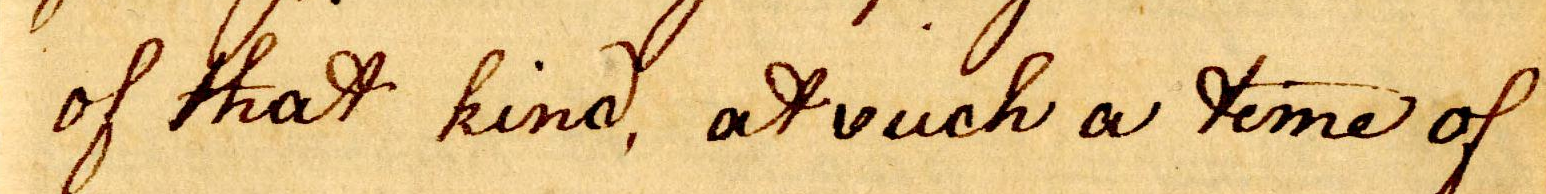of that kind, at such a time of
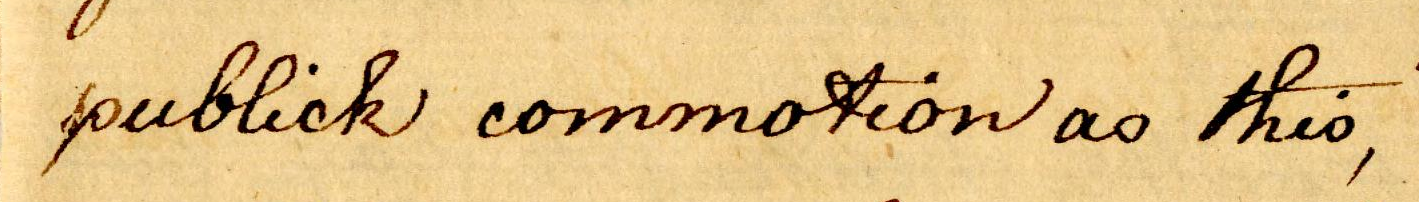publick commotion as this,
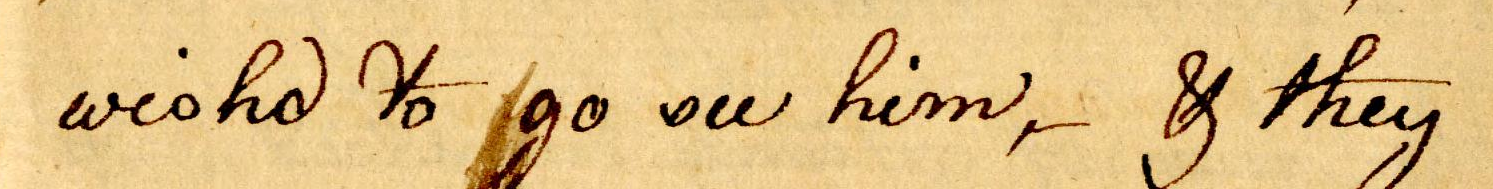wishd to go see him,- & they
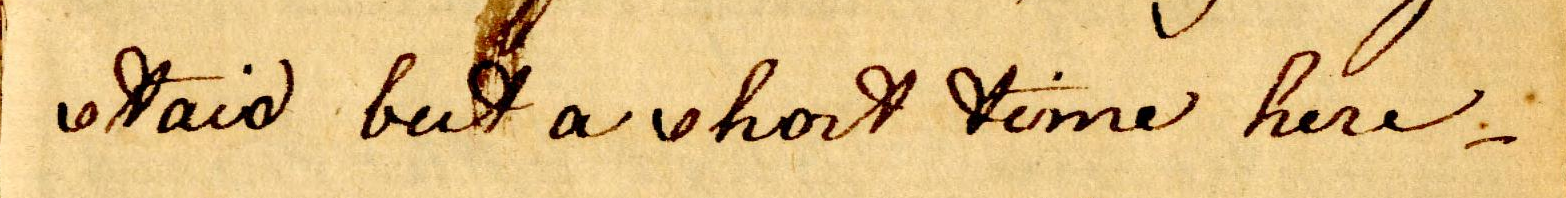staid but a short time here-
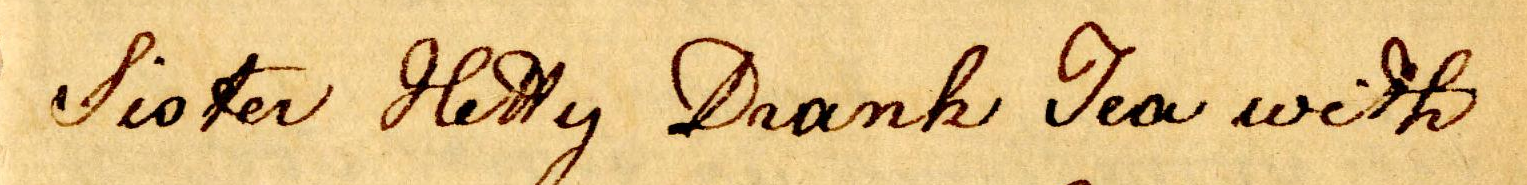Sister Hetty Drank Tea with
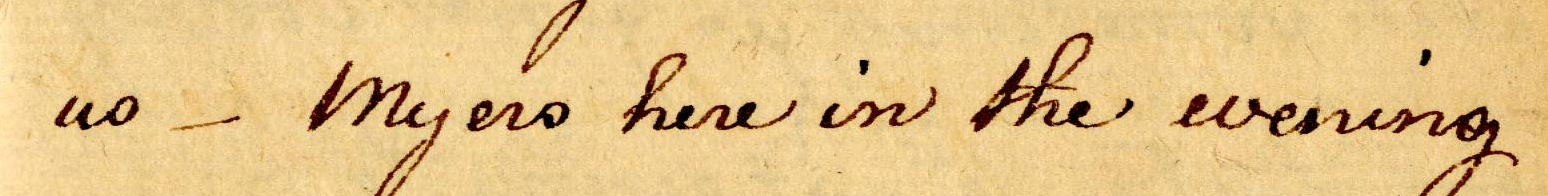us- Myers here in the evening
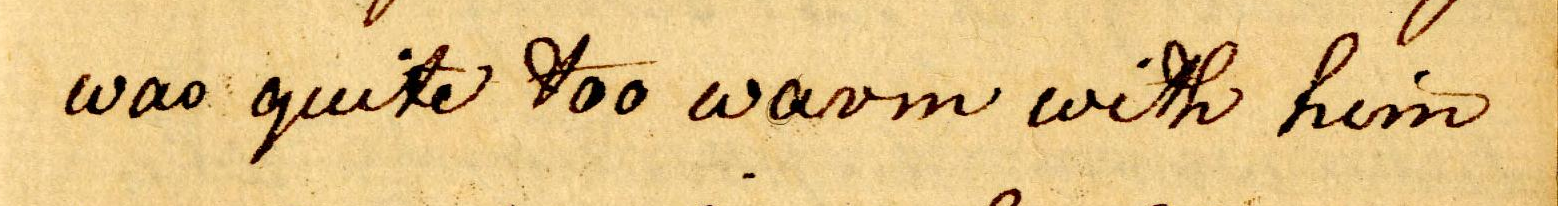was quite too warm with him
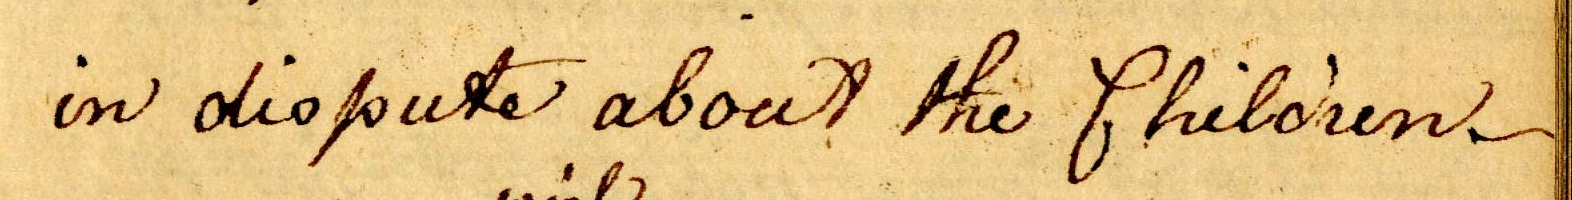in dispute about the Children-
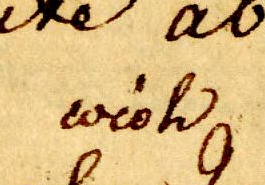wish
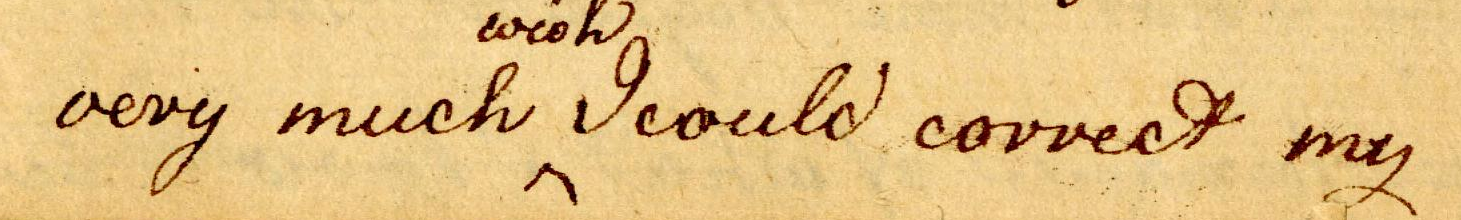very much ^ I could correct my
